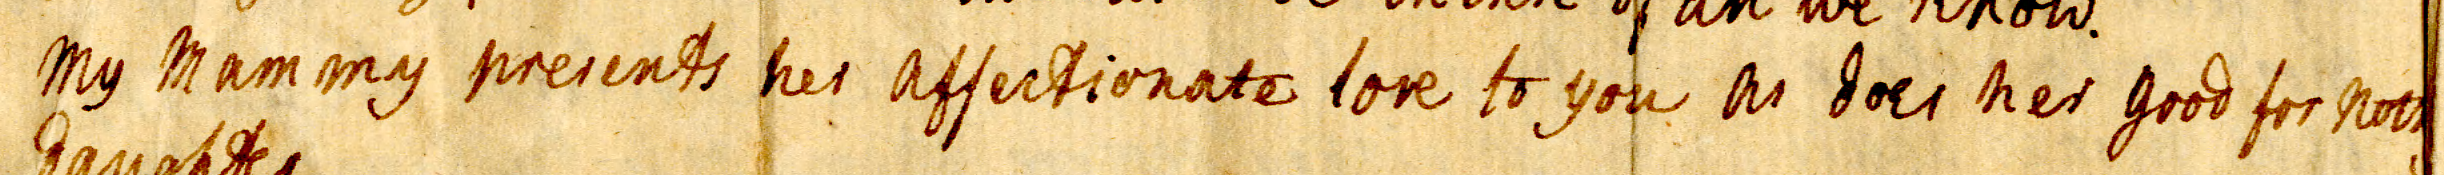My mammy presents her affectionate love to you as does her good for noth
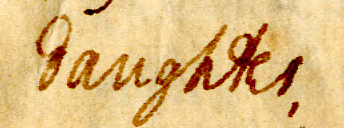daughter,
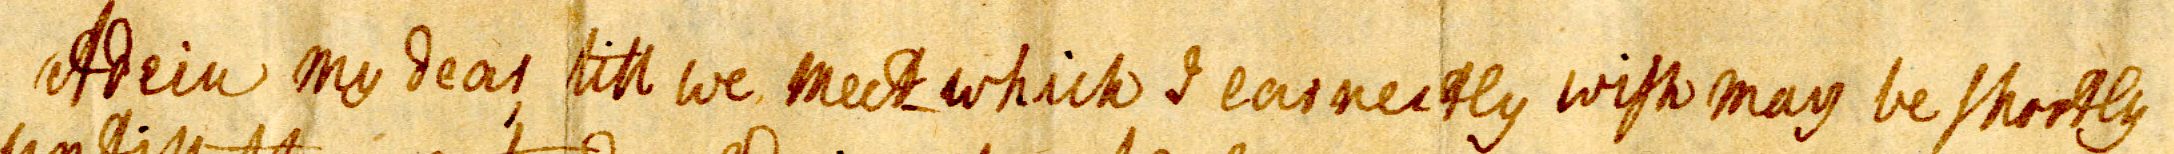Adeiu my dear, till we meet which I earnestly wish may be shortly
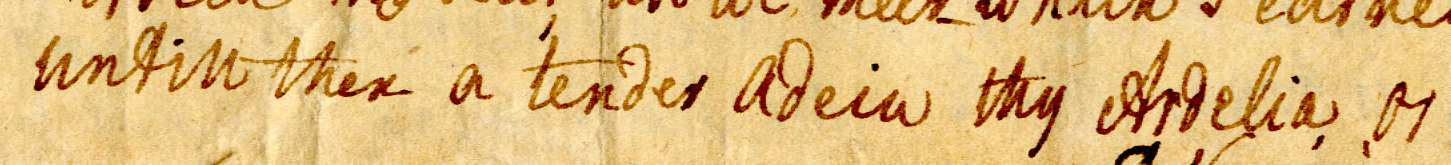untill then a tender adieu thy Ardelia or
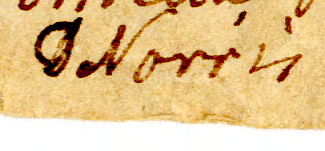D Norris
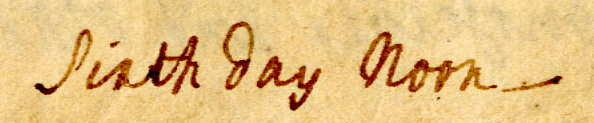sixth day noon-
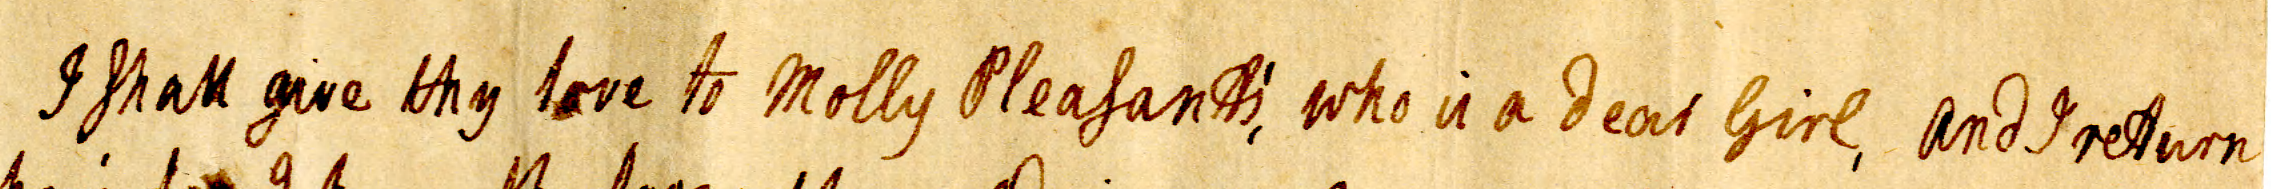I shall give thy love to Molly Pleasant's, who is a dear Girl, and I return
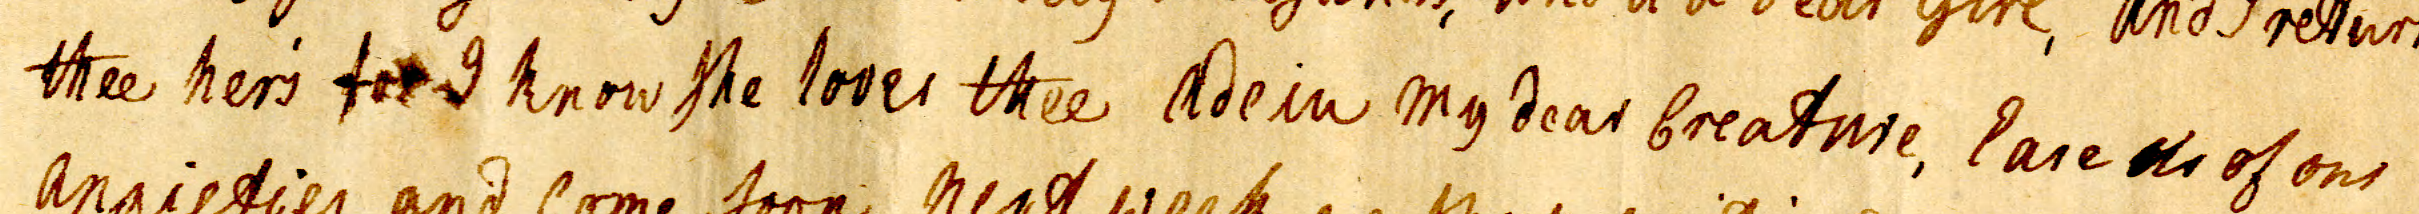thee her's for I know she loves thee Adeiu my dear Creature, Care of our
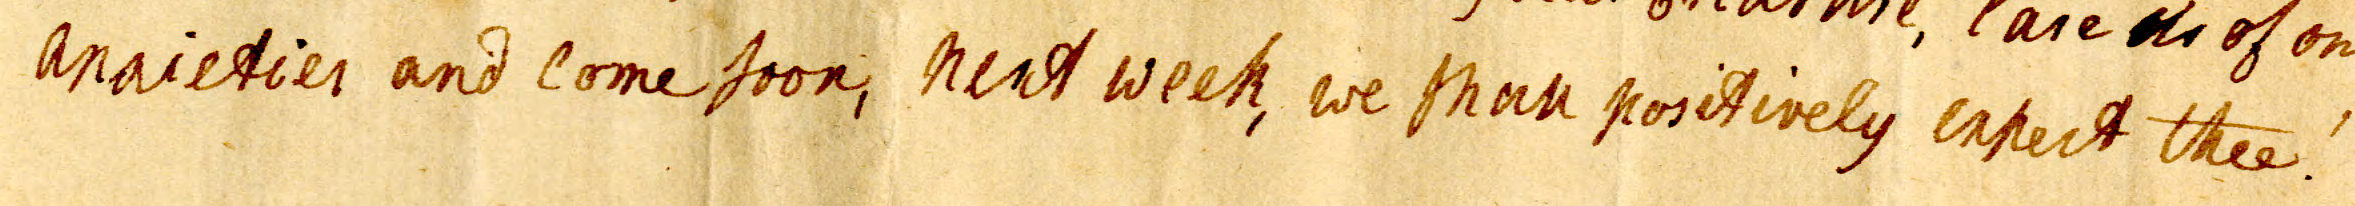anxieties and come soon, next week, we shall positively expect thee!
